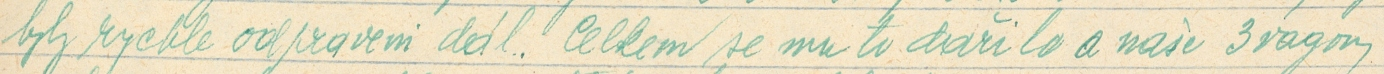byly rychle odpraveni dál. Celkem se mu to dařilo a naše 3 vagony
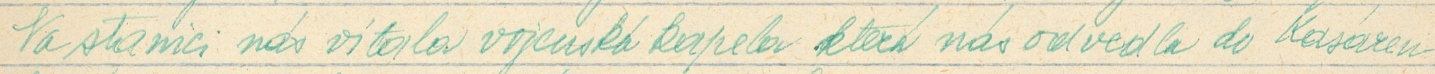Na stanici nás vítala vojenská kapela která nás odvedla do kasáren
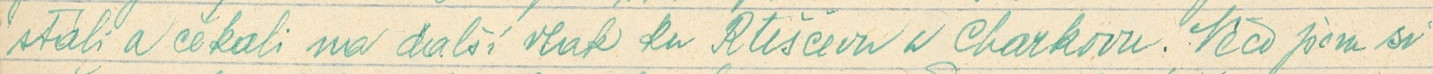stáli a čekali na další vlak ku Rteščevu a Charkovu. Něco jsem si
